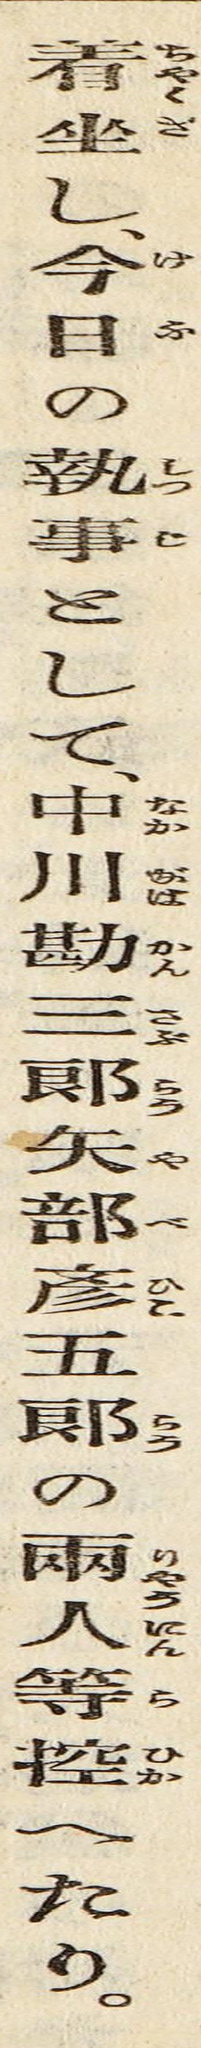着座し、今日の執事として、中川勘三郎矢部彦五郎の両人等控へたり。
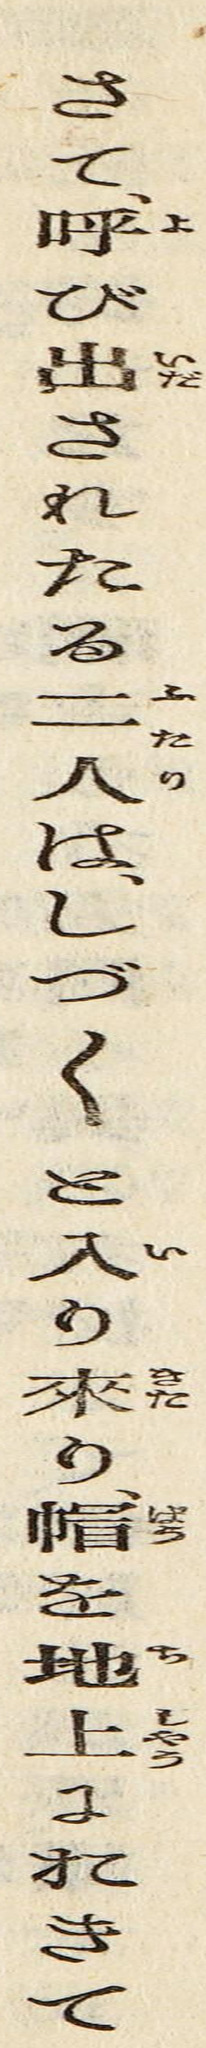さて、呼び出されたる二人は、しづ〳〵と入り来り帽を地上におきて
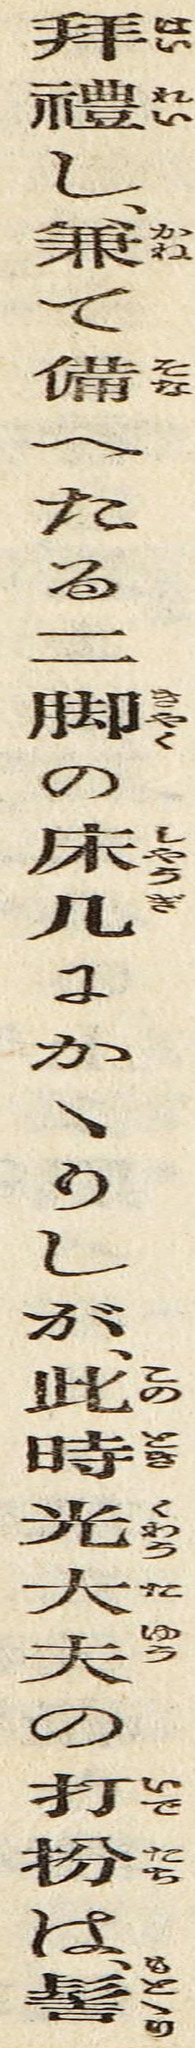拝礼し、兼ねて備へたる二脚の床几にかゝりしが、此時光大夫の打扮は、髻
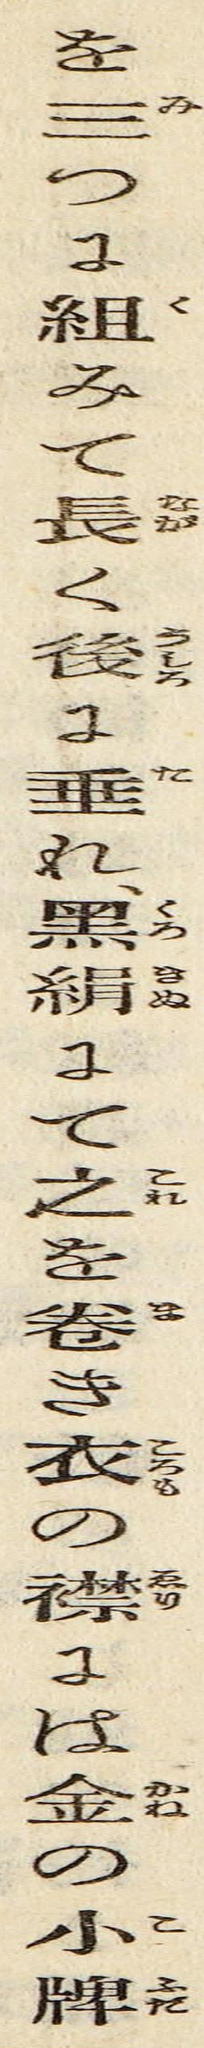を三つに組みて長く後に垂れ、黒絹にて之を巻き衣の襟には金の小牌

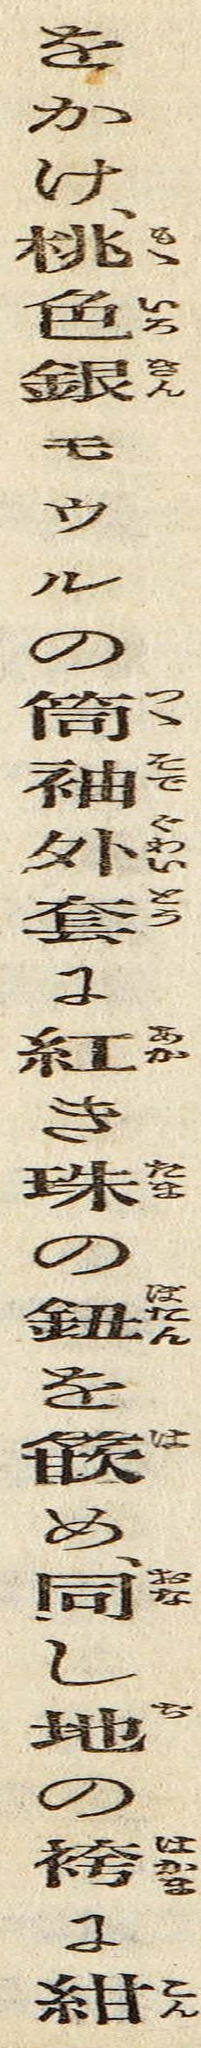をかけ、桃色銀モウルの筒袖外套に紅き珠の鈕を篏め、同じ地の袴に紺
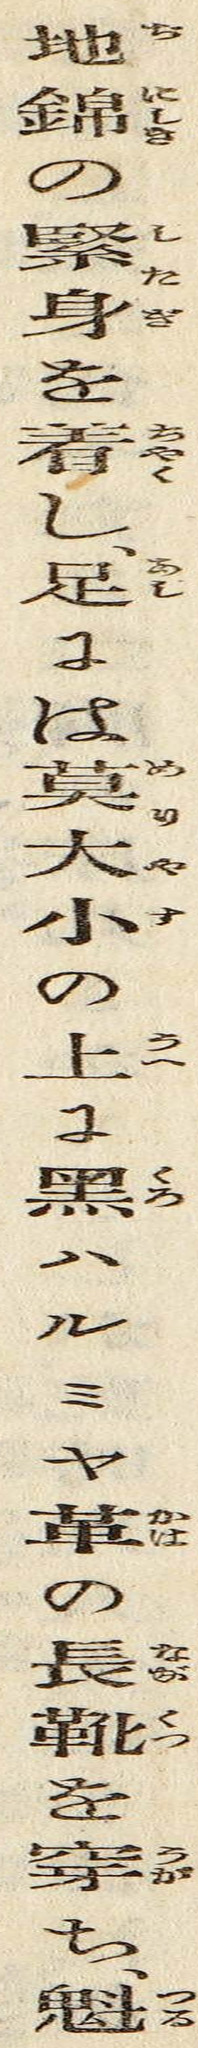地錦の緊身を着し、足に莫大小の上に黒ハルミヤ革の長靴を穿ち、魁
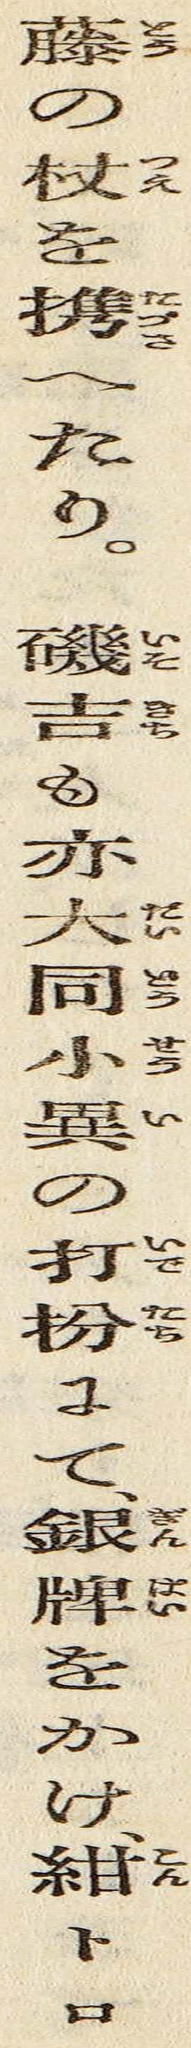藤の杖を携へたり。磯吉も亦大同小異の打扮にて、銀牌をかけ、紺トロ
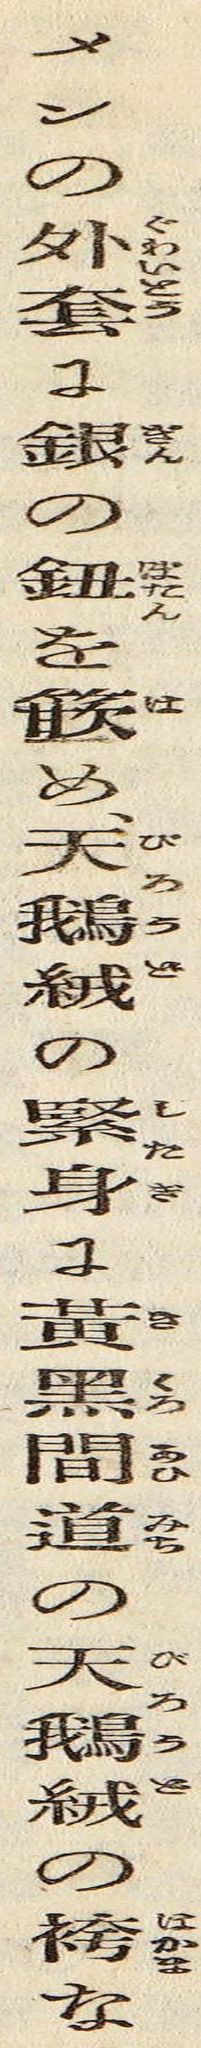メンの外套に銀の鈕を篏め、天鵞絨の緊身に黄黒間道の天鵞絨の袴な
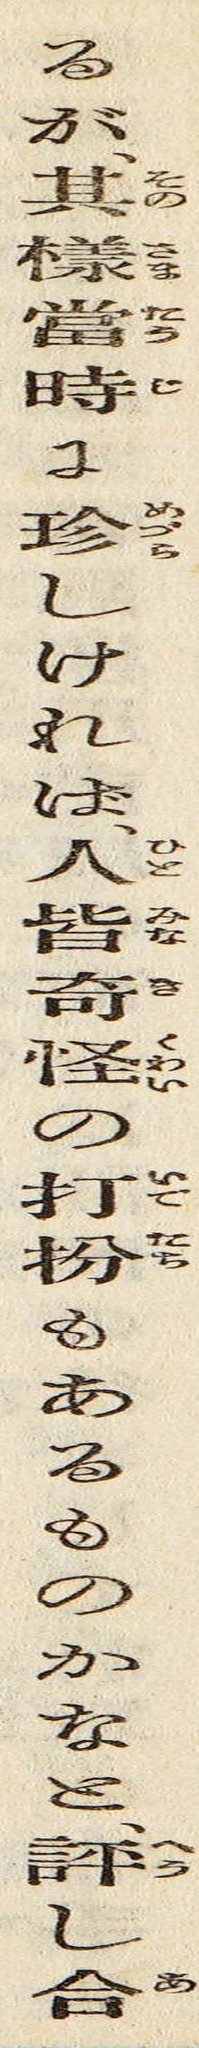るが、其様当時に珍しければ、人皆奇怪の打扮もあるものかなと、評し合
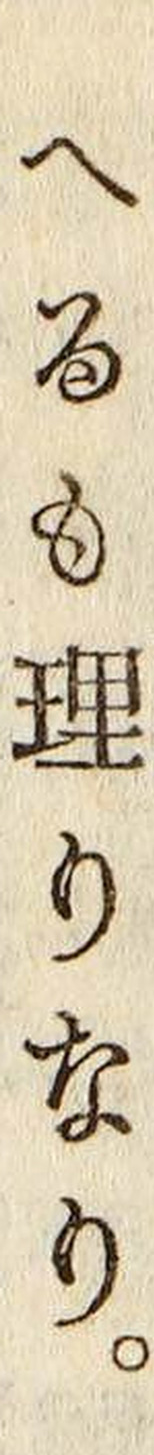へるも理りなり。
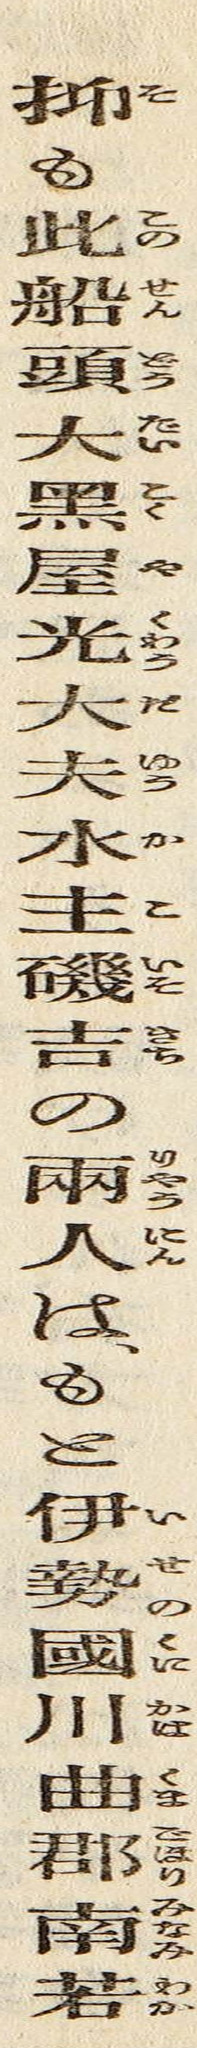抑も此船頭大黒屋光大夫水主磯吉の両人は、もと伊勢国川曲郡南若
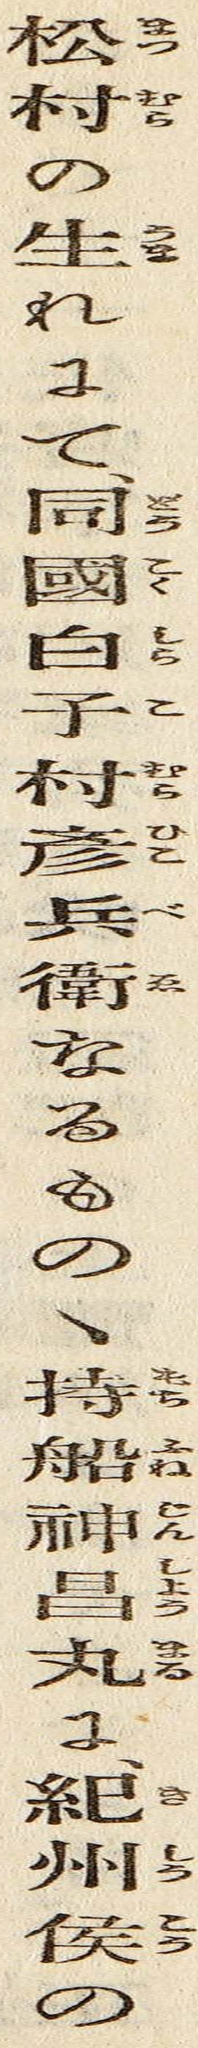松村の生れにて、同国白子村彦兵衛なるものゝ持船神昌丸に、紀州侯の
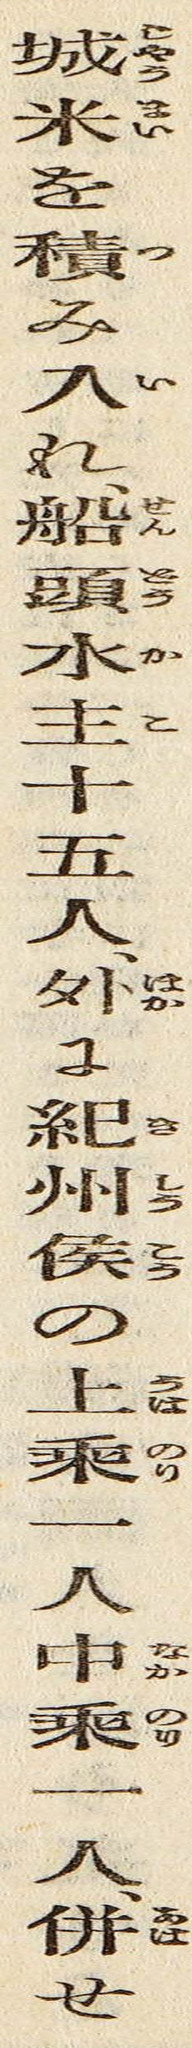城米を積み入れ、船頭水主十五人、外に紀州侯の上乗一人中乗一人、併せ
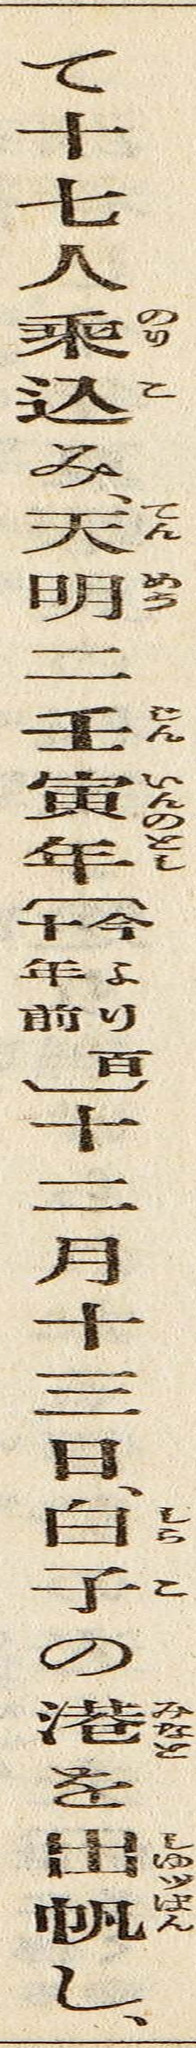て十七人乗込、天明二壬寅年[今より百十年前]十二月十三日、白子の港を出帆し、
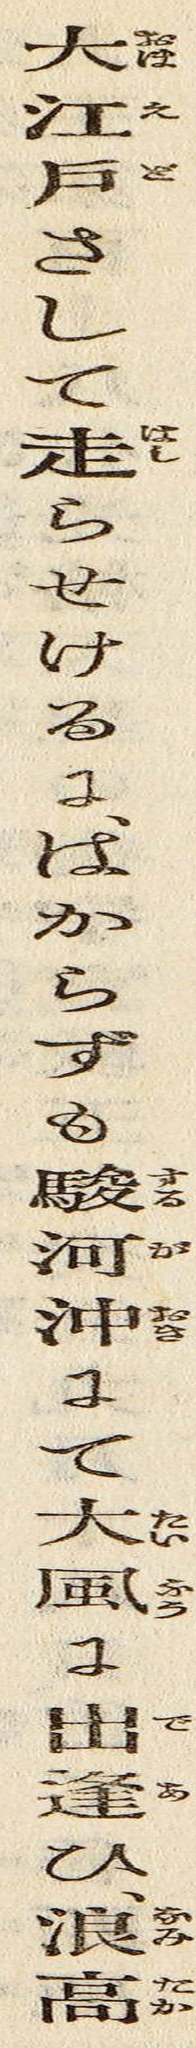大江戸さして走らせけるに、はからずも駿河沖にて大風に出逢ひ、浪高
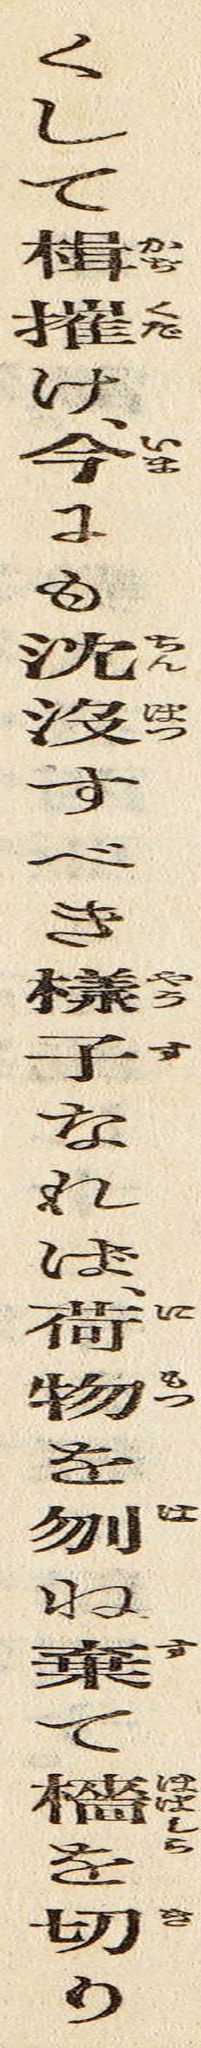くして楫摧け、今にも沈没すべき様子なれば、荷物を刎ね棄て檣を切り
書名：日本漂流譚
